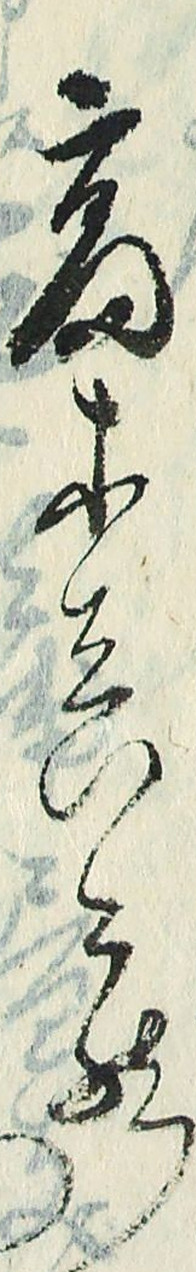高木真蔵

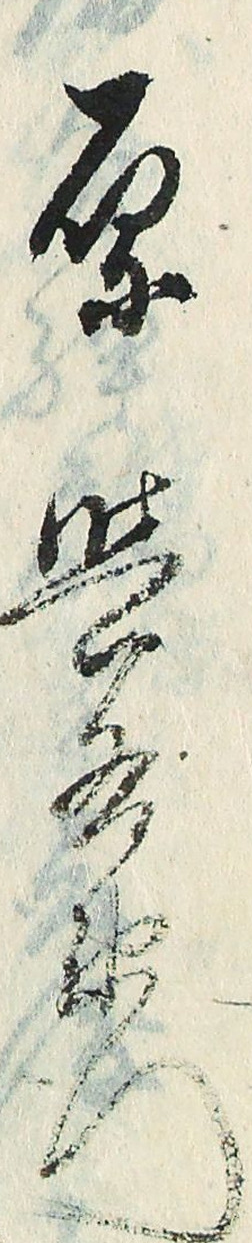原与右衛門
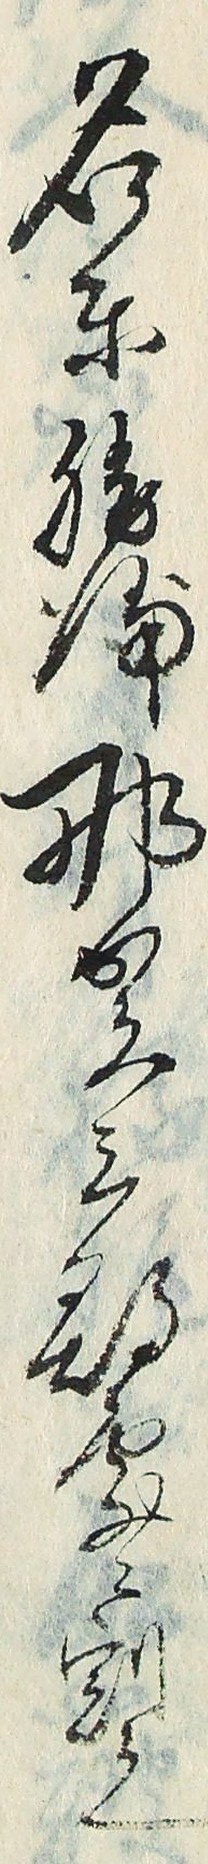名東勝浦那賀三郡処々割元
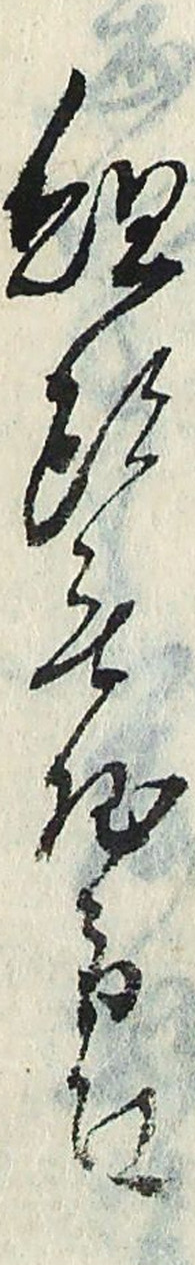組頭庄屋方え
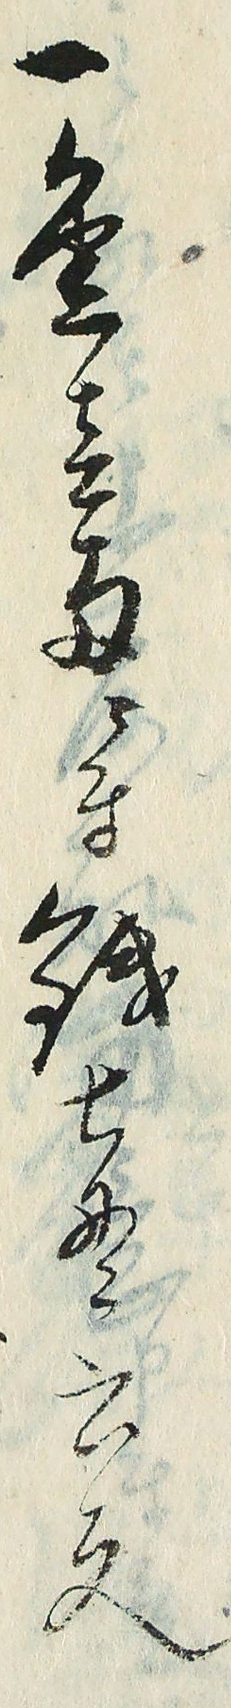一金壱両に付銭七貫六文
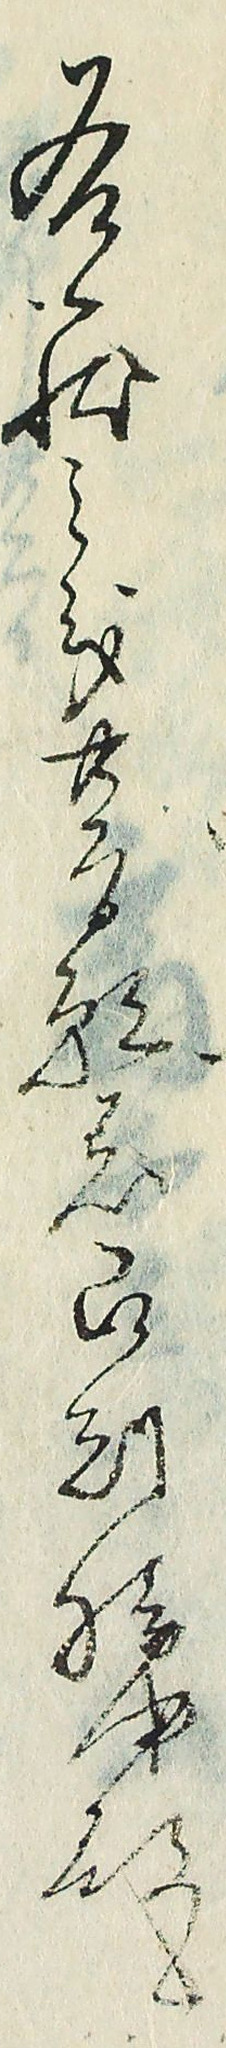右御状之義廿二日到着即刻勝浦郡へ
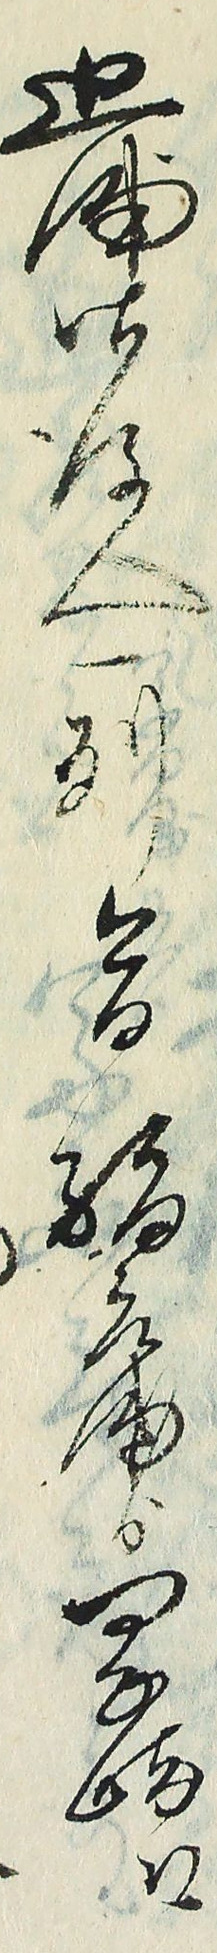廻浦御役人一列今日福良浦ゟ岡崎え
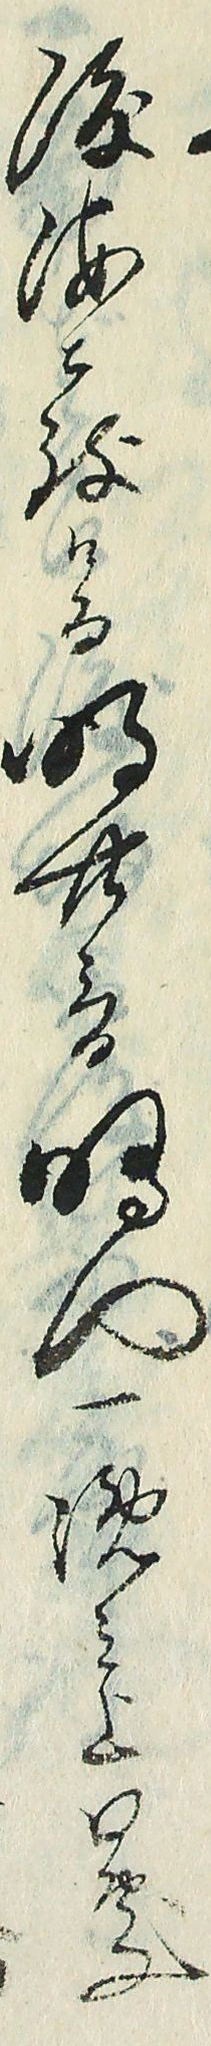渡海被致候て明廿三日鳴門一覧之上同処
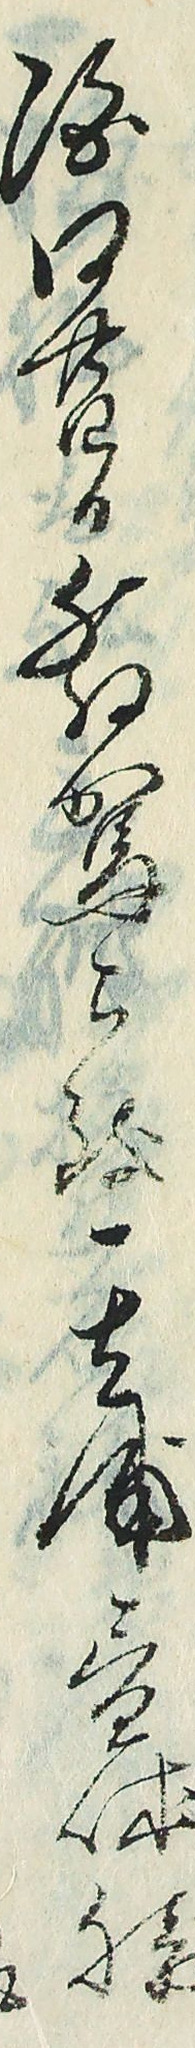泊同廿四日乗駕被致其浦昼休勝
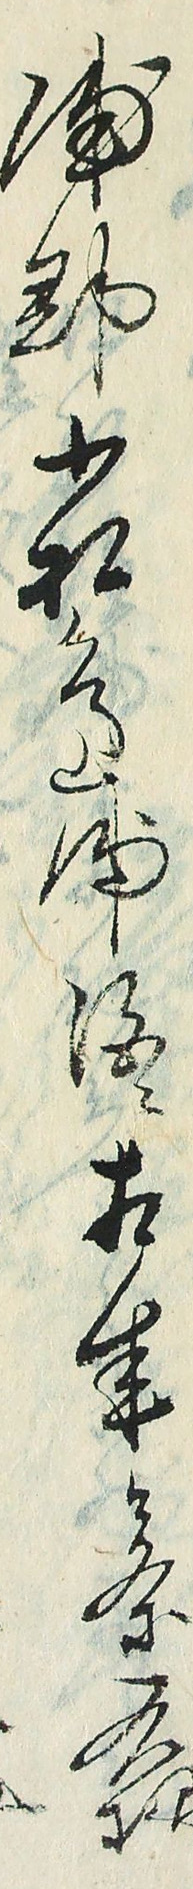浦郡小松島浦泊に相成候条右様
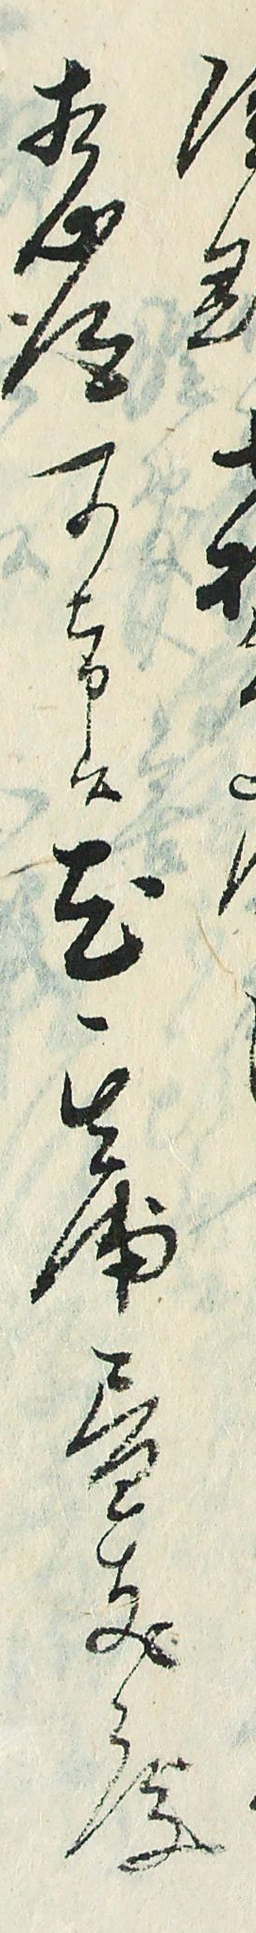相心得可被申候尤其浦昼支度

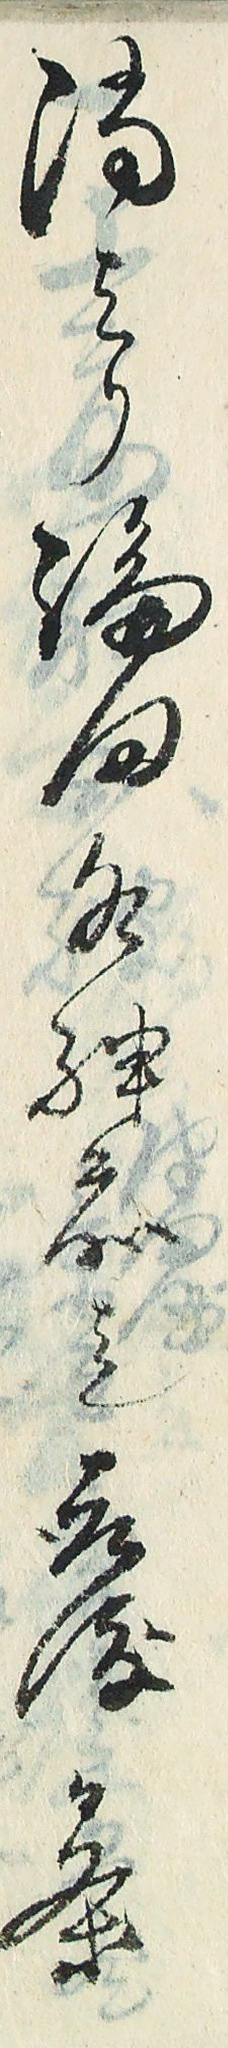場より論田水神前迄取渡候条
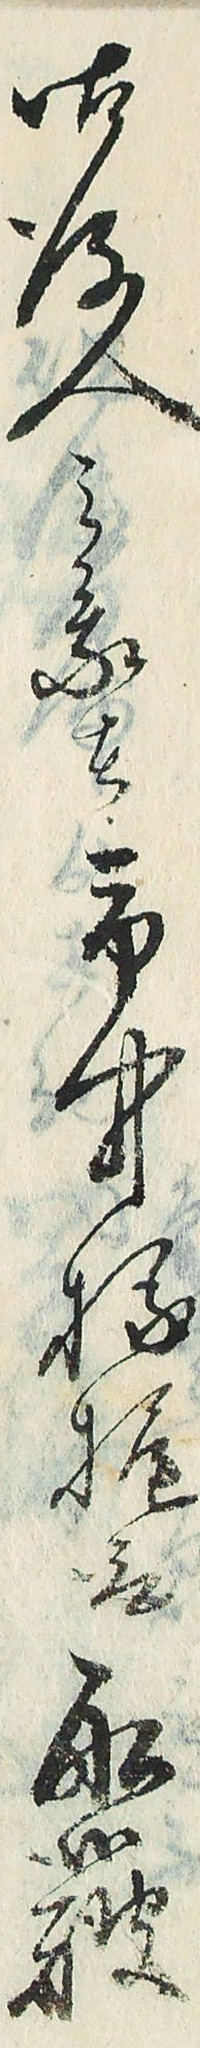御役人之義は市中持梶取船弐艘
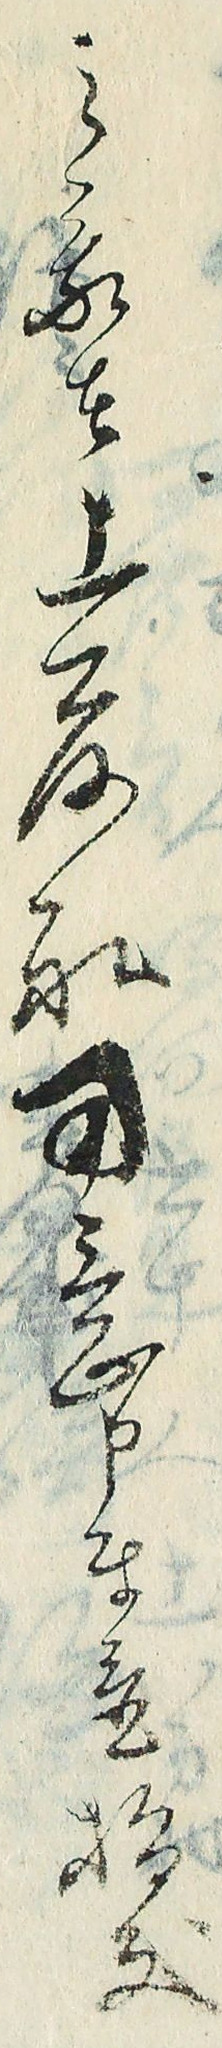之義は上荷船用意申付置指支
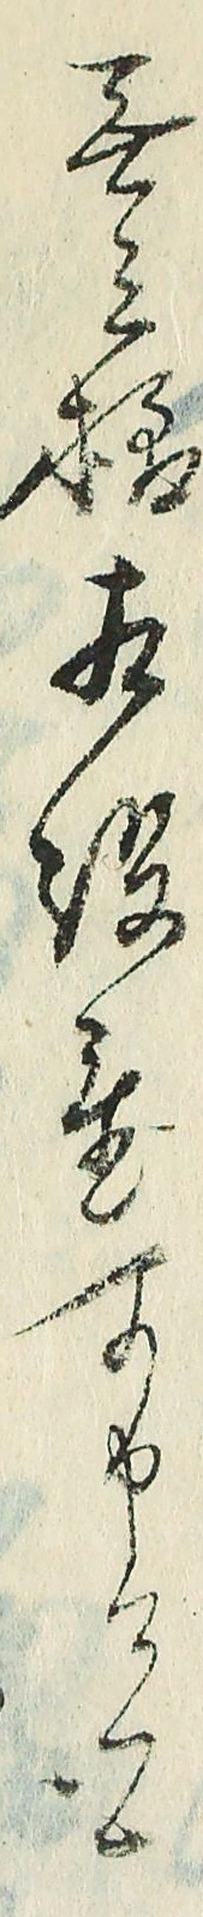無之様相設置可申候以上
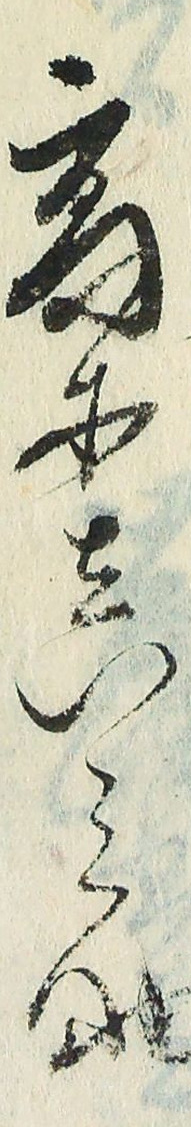高木真之助
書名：公辺御役人為御廻浦御立越諸御用一巻
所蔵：鳴門教育大学 Naruto University of Education
